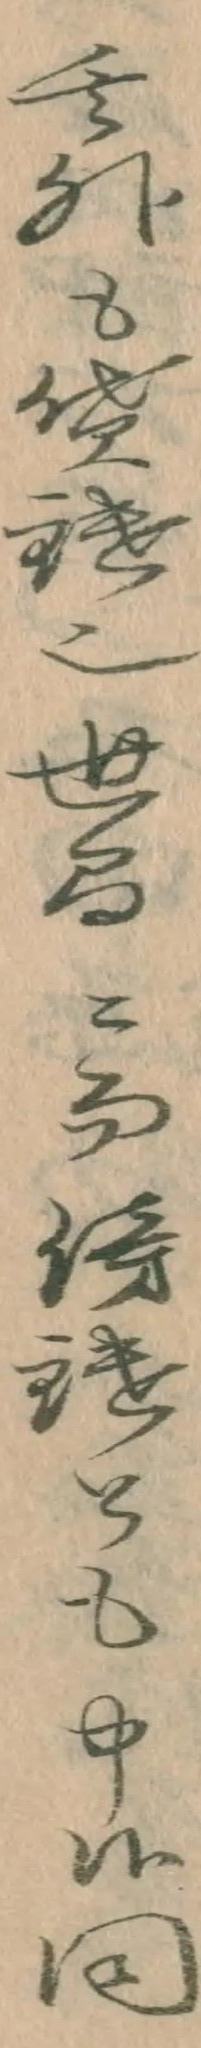其外も貸鑓也世間に而傍鑓とも申候同
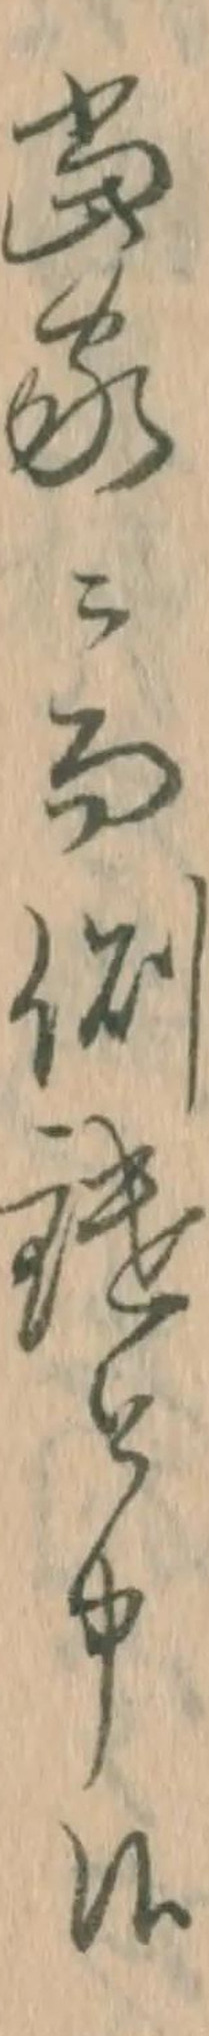当家に而例鑓と申候
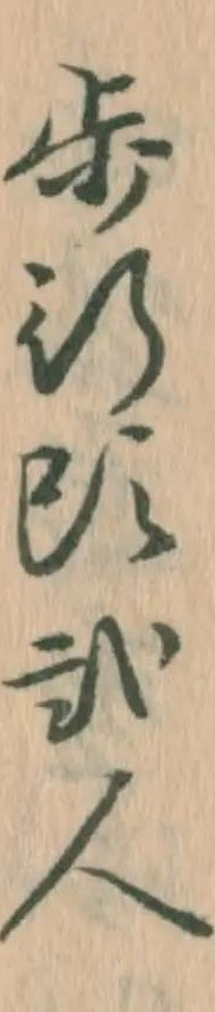歩行頭弐人
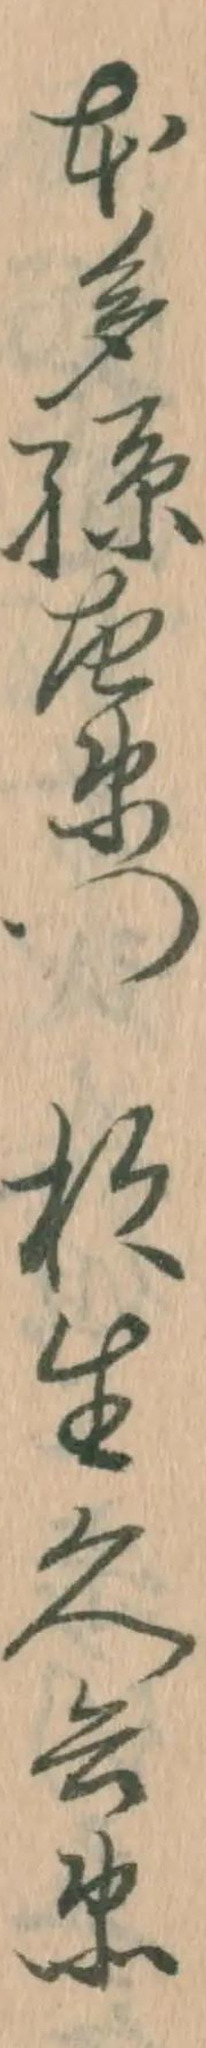本多孫左衛門杉生久兵衛
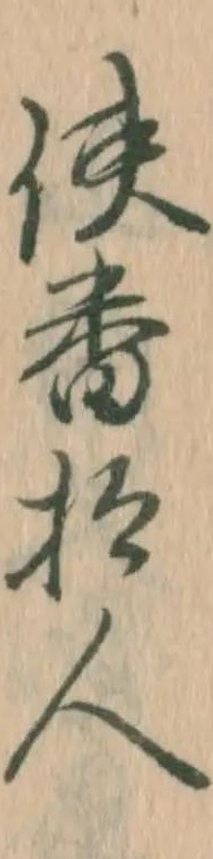使番拾人
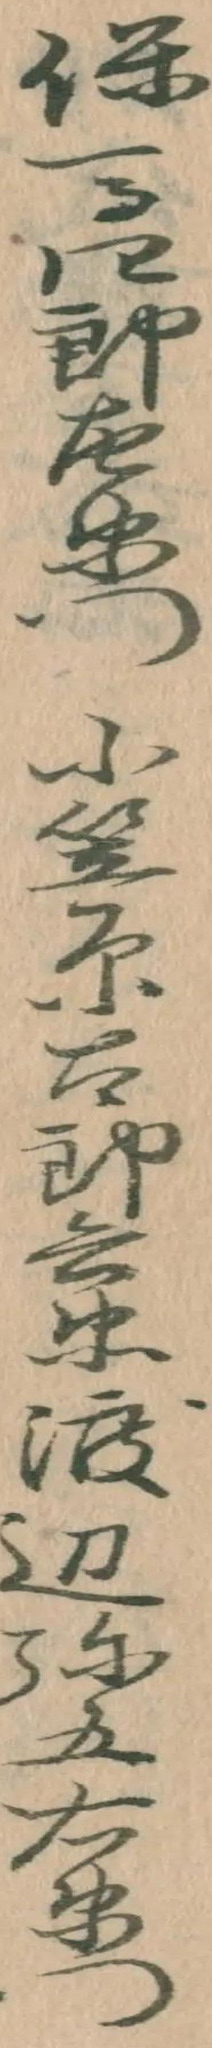保馬四郎左衛門小笠原太郎兵衛渡辺弥五右衛門
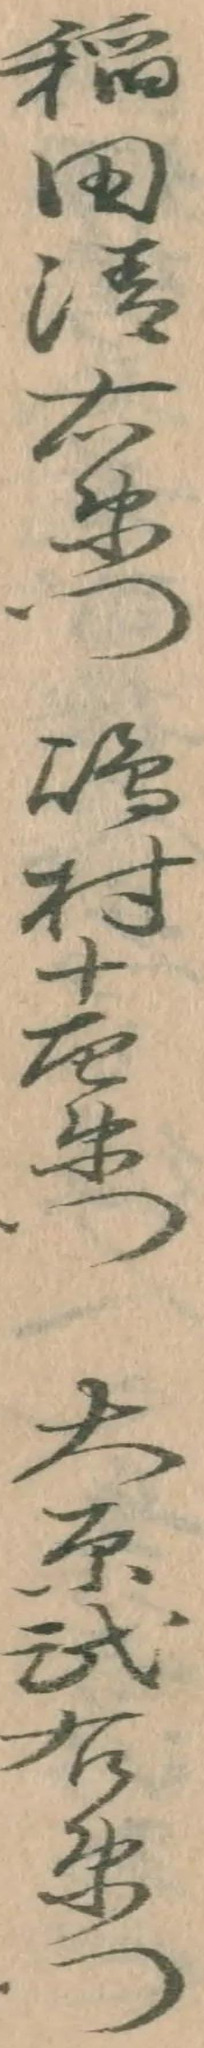稲田清右衛門島村十左衛門大原武右衛門
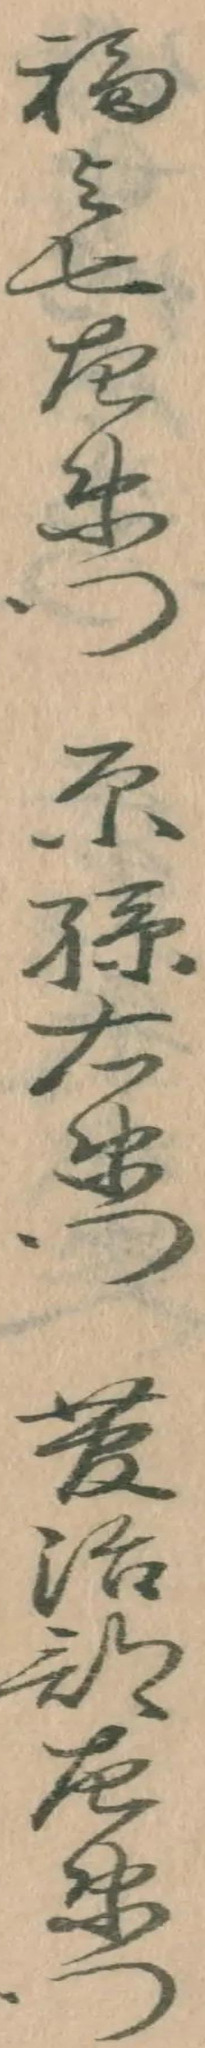福与七左衛門原孫右衛門菅治部左衛門
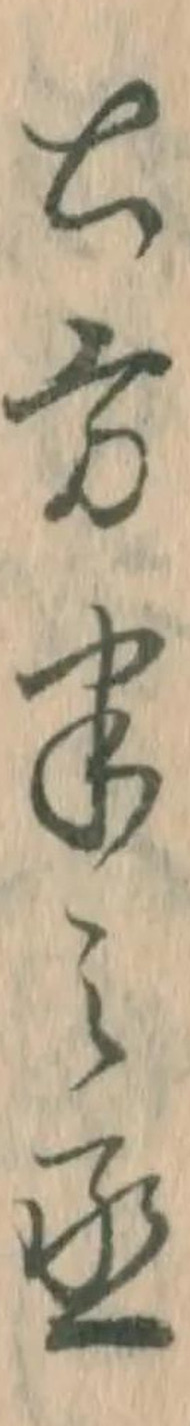土方半之丞
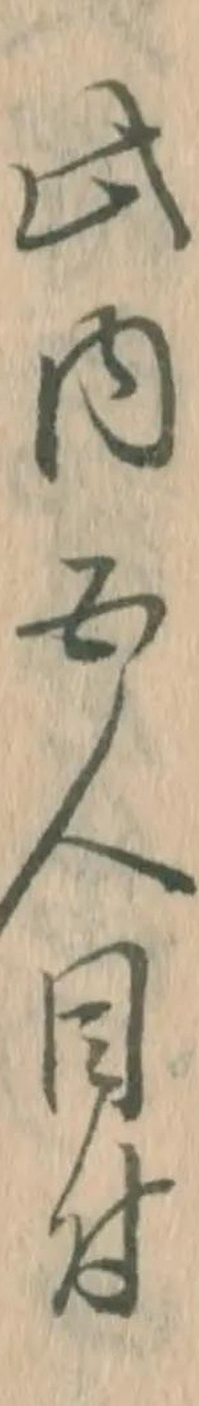此内五人目付
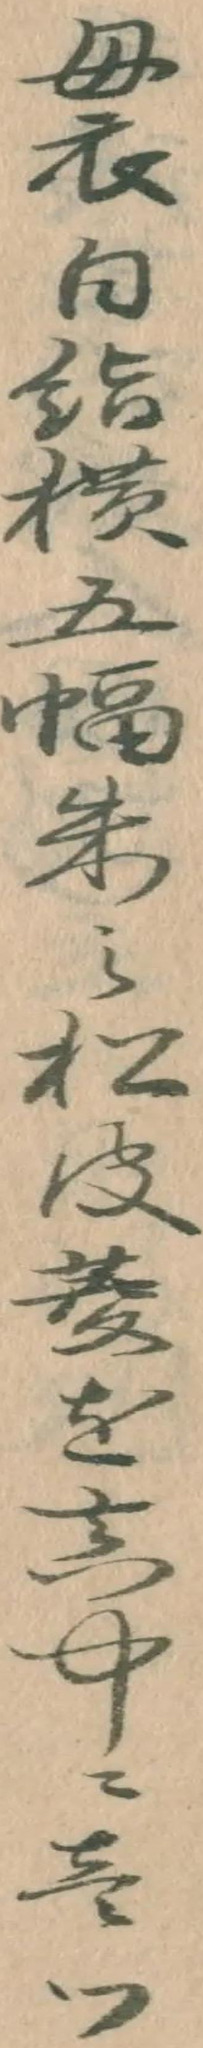母衣白絹横五幅朱之松皮菱を真中に壱つ
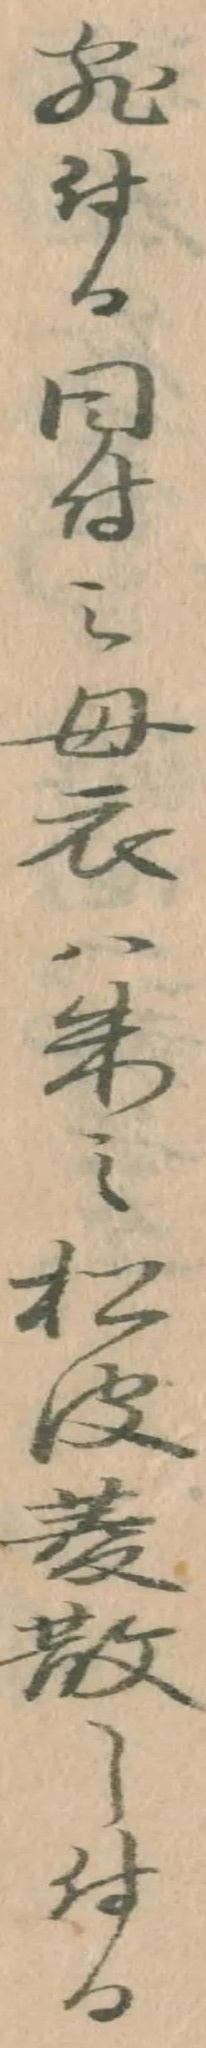究付る日付之母衣は朱之松皮菱散し付る
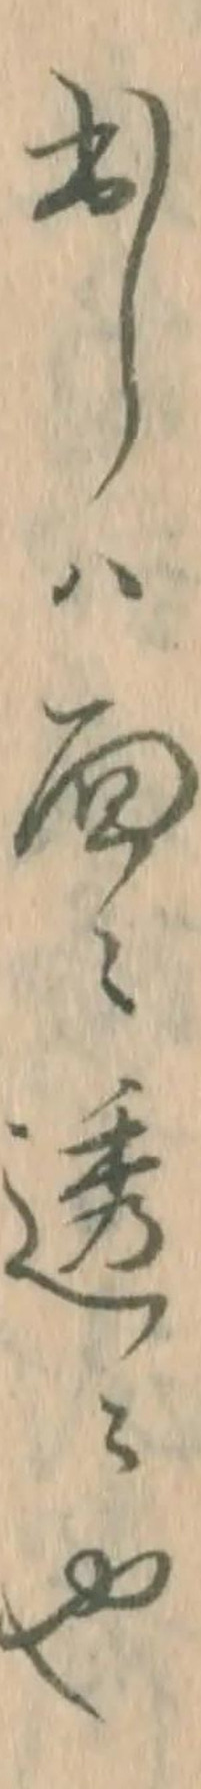出しは面々透に也

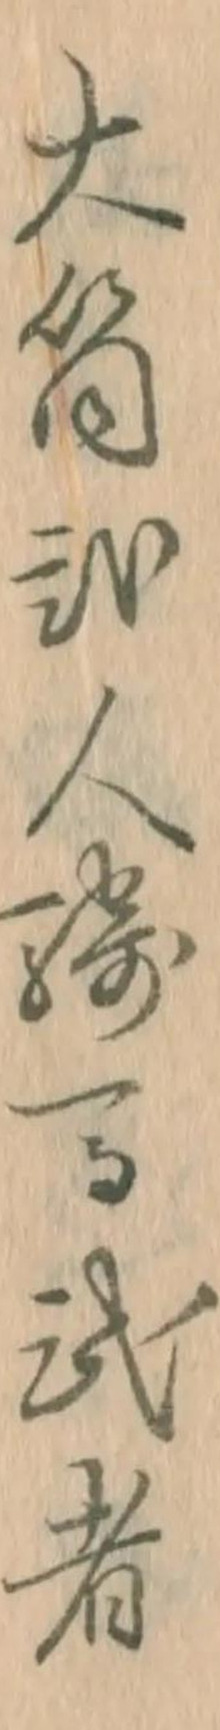大筒弐人騎馬武者
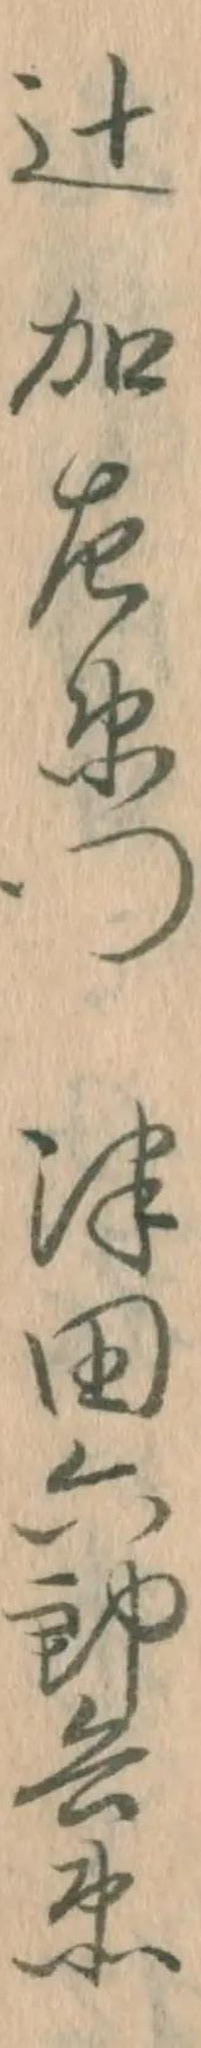辻加左衛門津田六郎兵衛
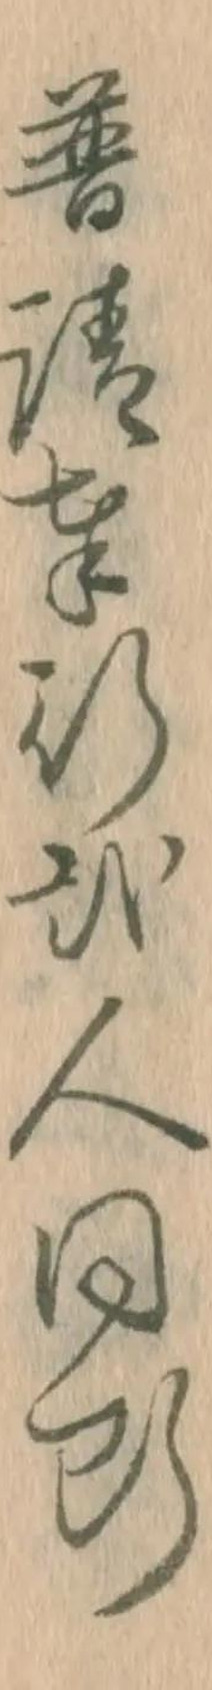普請奉行弐人同断
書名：切支丹御退治記 49巻. [6]
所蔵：国立国会図書館 National Diet Library, JAPAN
